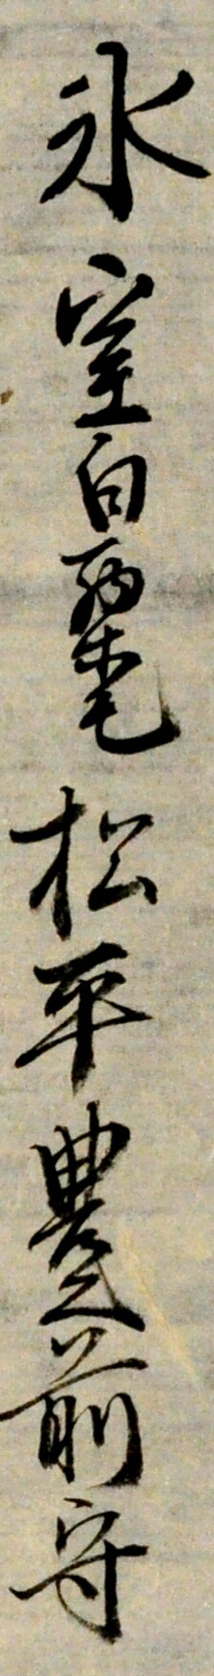氷室白粟毛松平豊前守
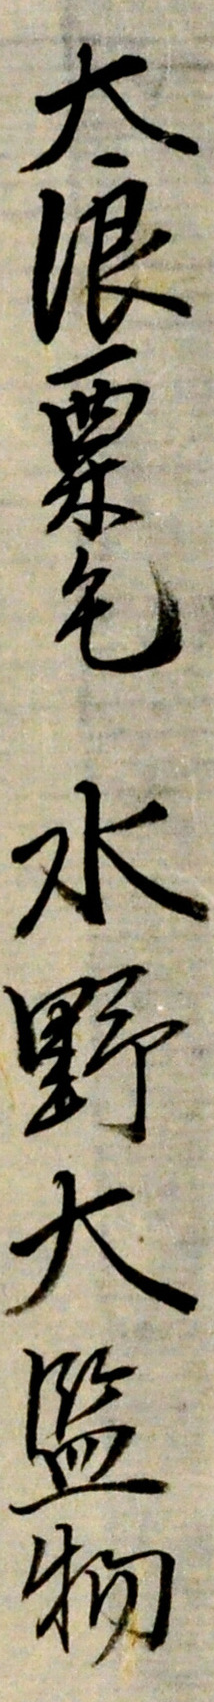大浪栗毛水野大監物
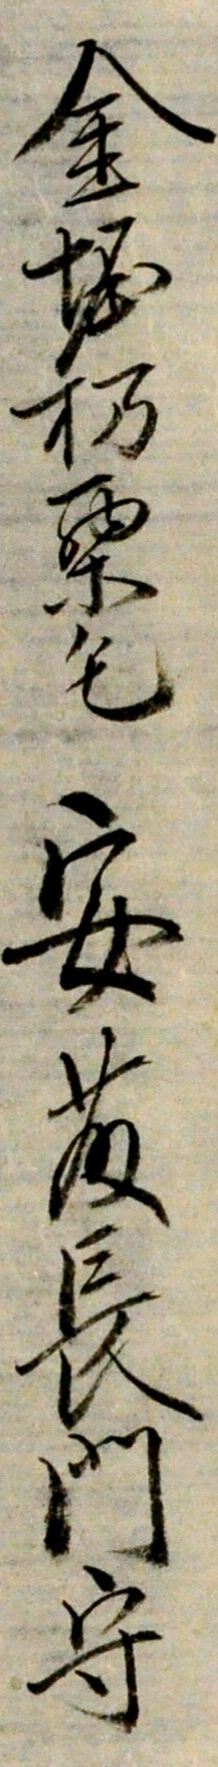金堀栃栗毛安藤長門守
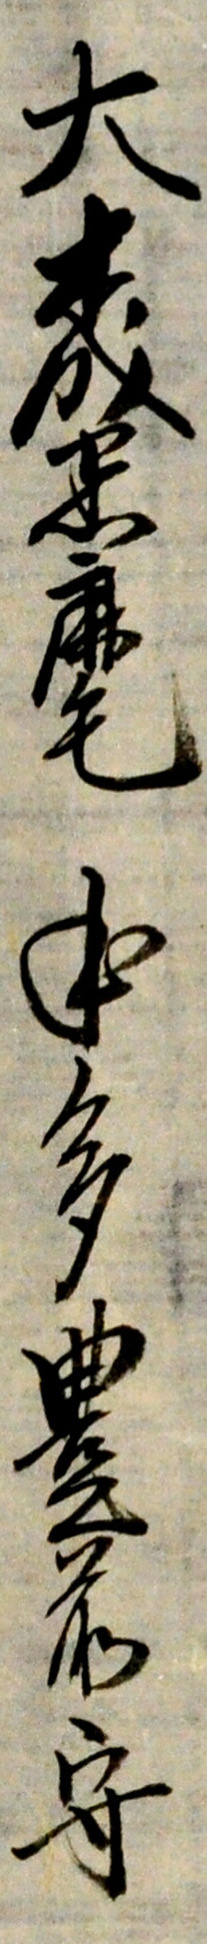大森黒鹿毛本多豊前守
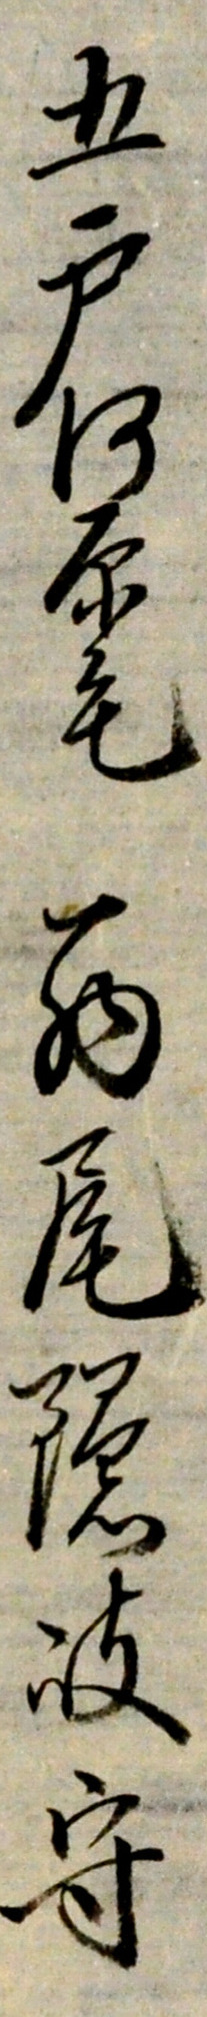五戸河原毛西尾隠岐守
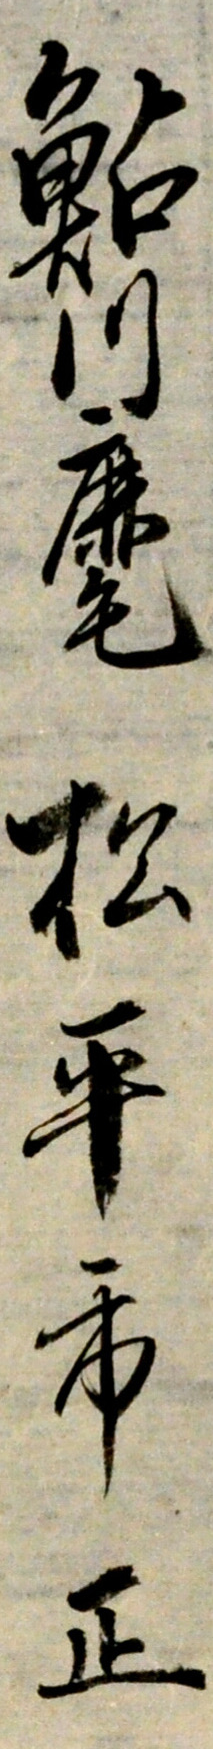鮎川鹿毛松平市正
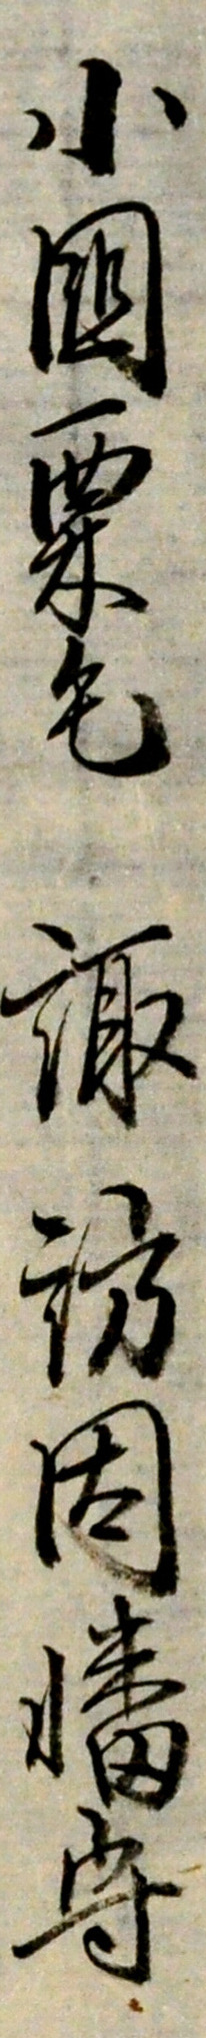小国栗毛諏訪因幡守
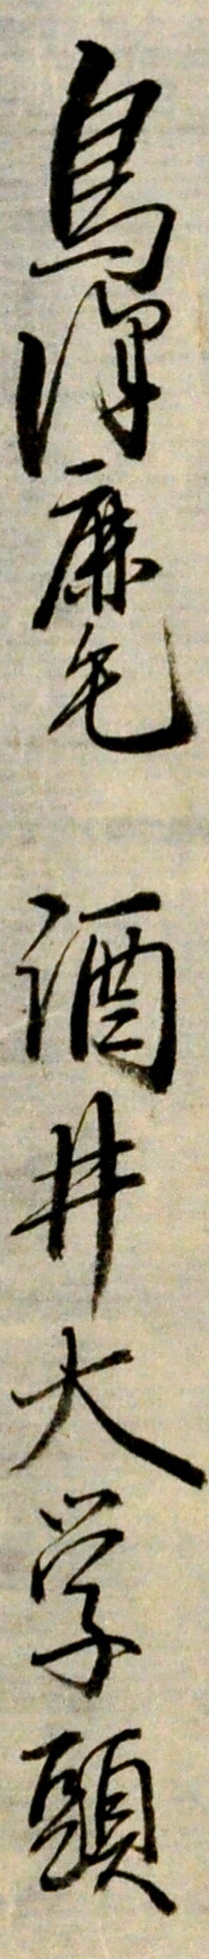烏沢鹿毛酒井大学頭
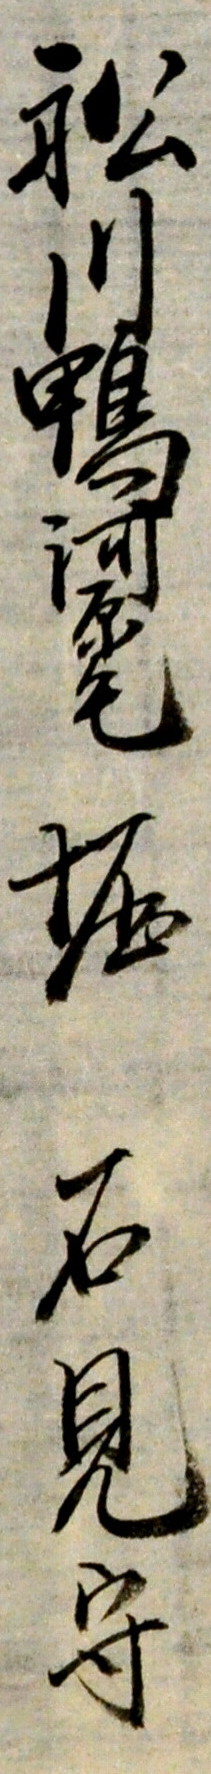船川鴨河原毛堀石見守
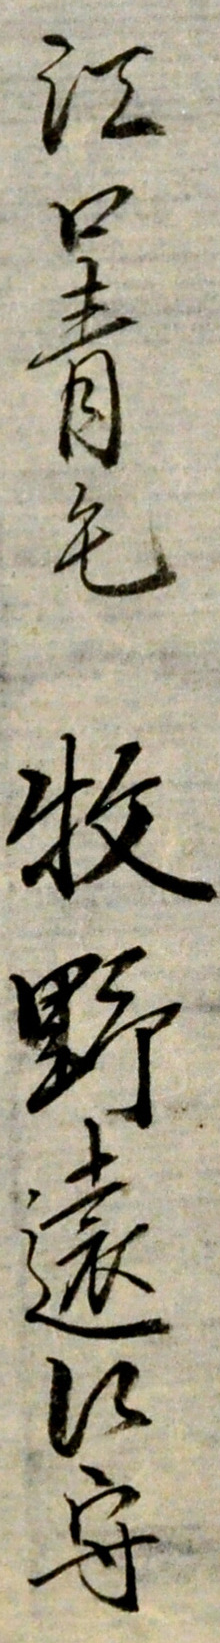江口青毛牧野遠江守

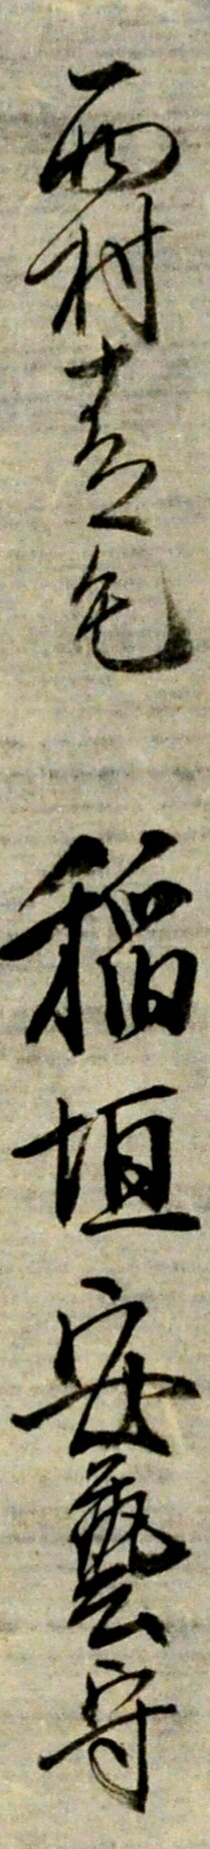西村青毛稲垣安芸守
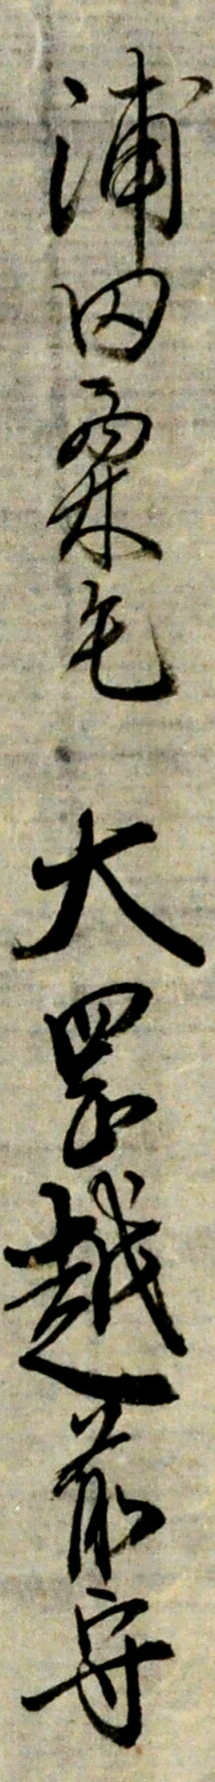浦田栗毛大岡越前守
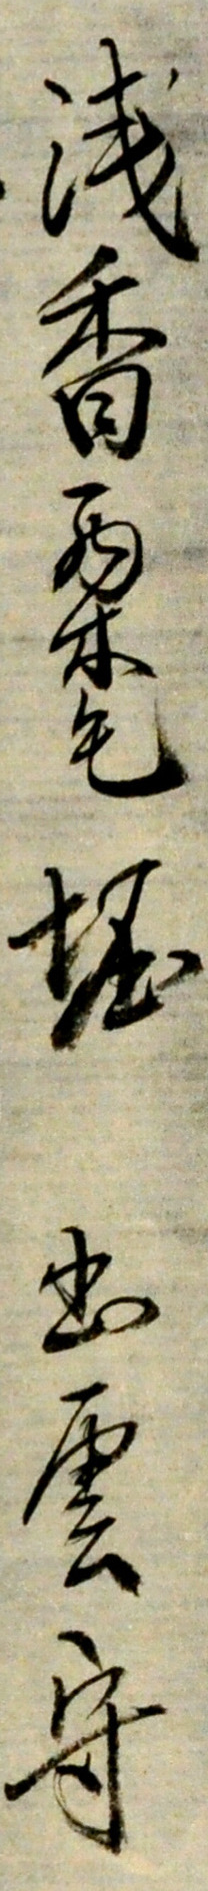浅香栗毛堀出雲守
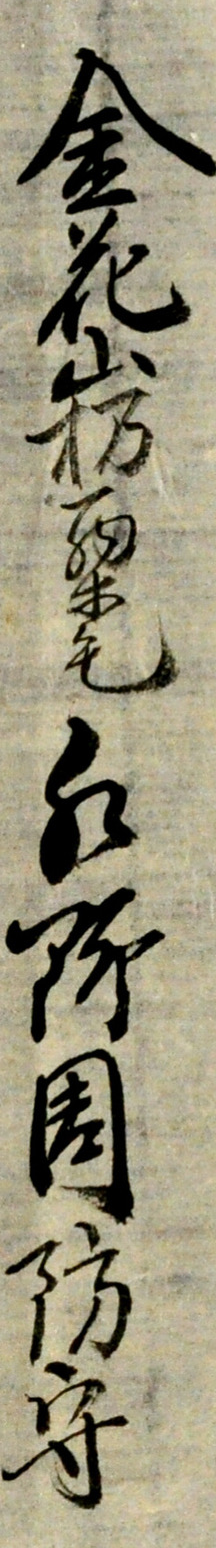金花山栃栗毛水野周防守
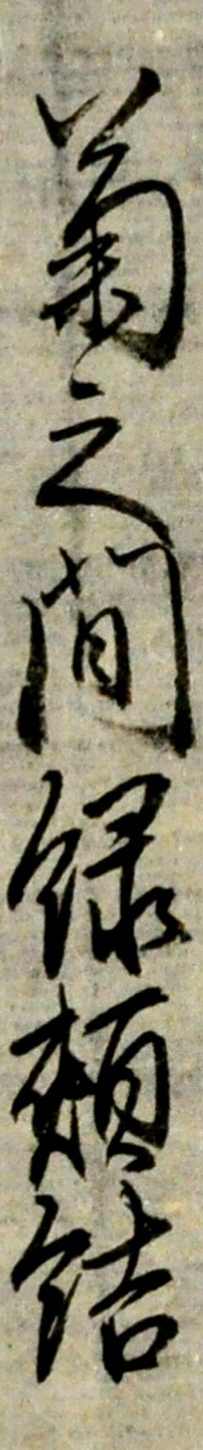菊之間縁頬詰
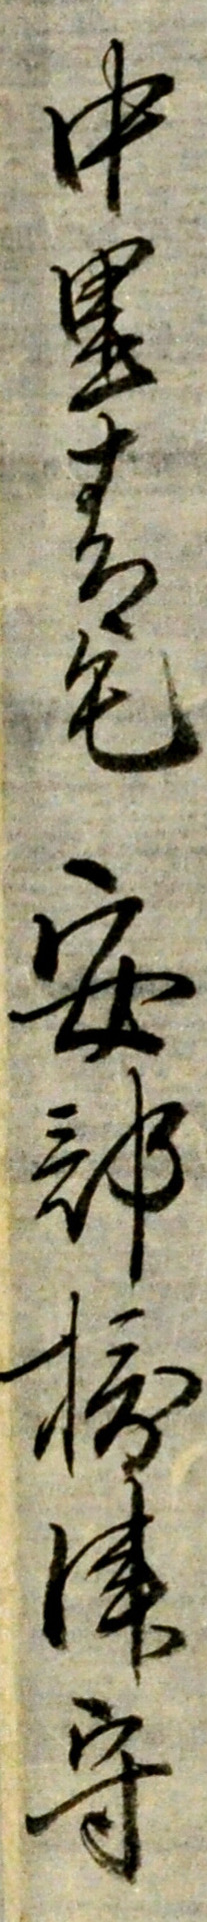中里青毛安部摂津守
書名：吹上御庭ニ於テ乗馬上覧ノ節留書外
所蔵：伊那市立高遠町図書館・合同会社AMANE
